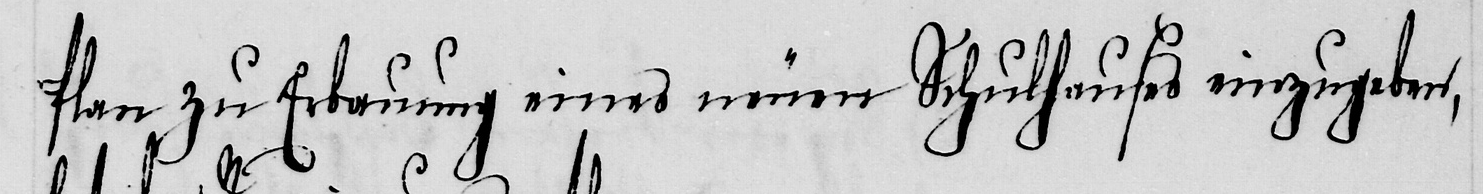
Plan zu Erbauung eines neuen Schulhauses einzugeben,
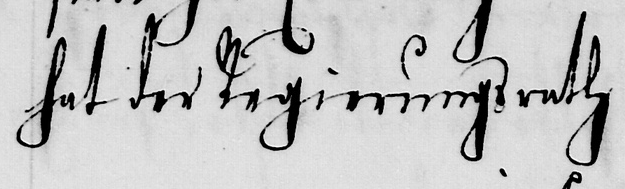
hat der Regierungsrath
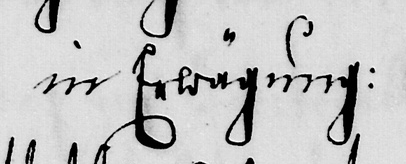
in Erwägung:
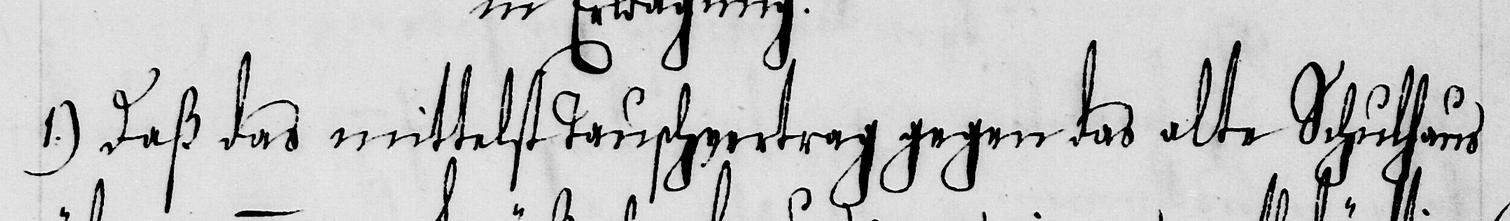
1.) Daß das mittelst Tauschvertrag gegen das alte Schulhaus
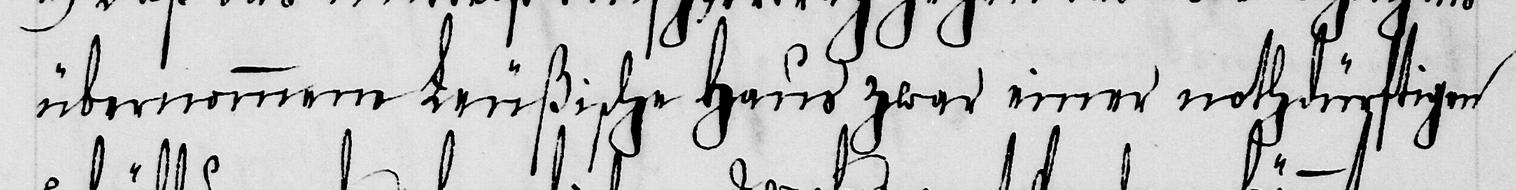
übernommene Leußische Haus zwar einer nothdürftigen
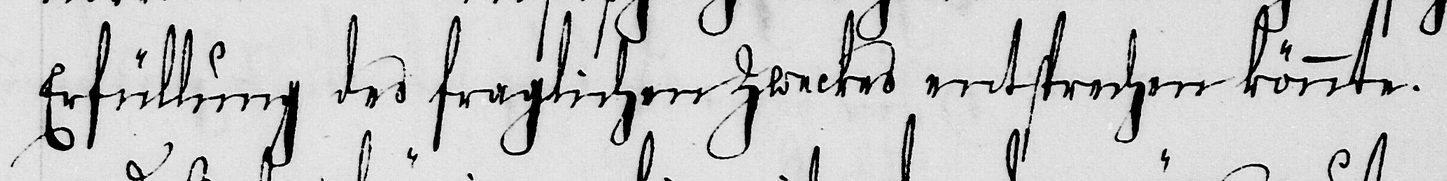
Erfüllung des fraglichen Zweckes entsprechen könnte.
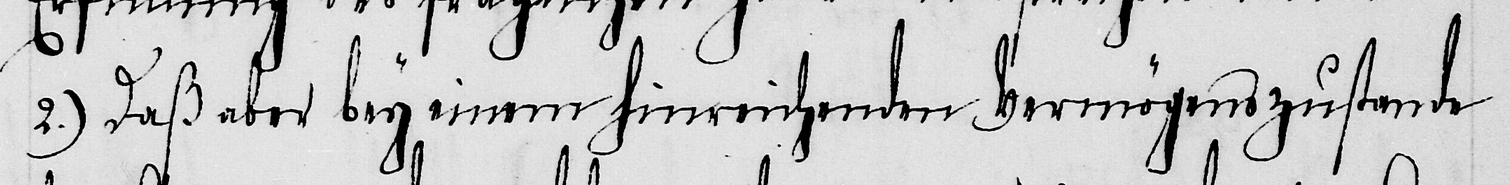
2.) Daß aber bey einem hinreichenden Vermögenszustande
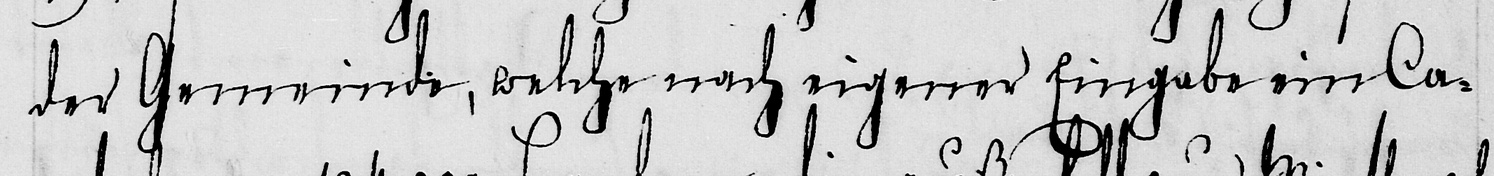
der Gemeinde, welche nach eigener Eingabe ein Ca¬
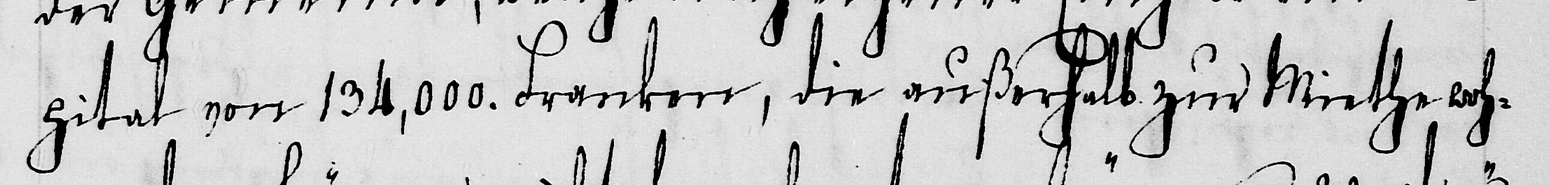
pital von 134,000. Franken, die außerhalb zur Miethe woh¬
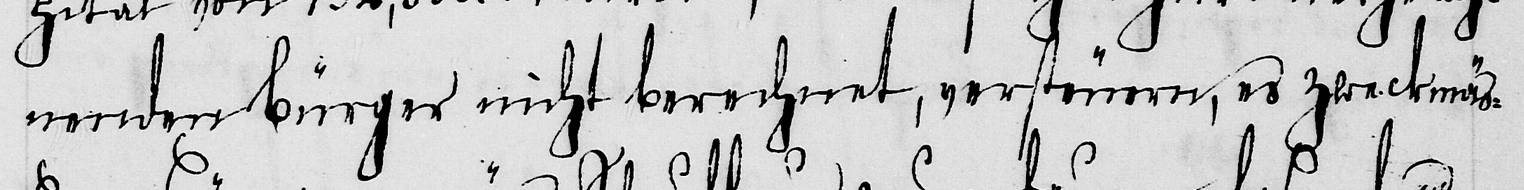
nenden Bürger nicht berechnet, versteuern, es zweckmäß¬
